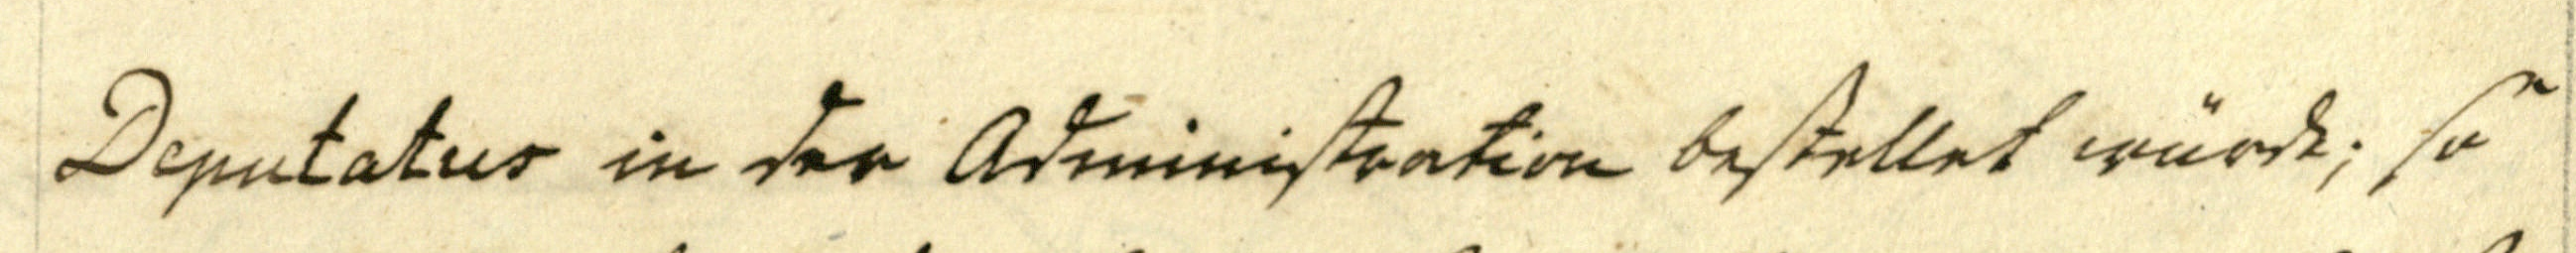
Deputatus in der Administration bestellet würde, so
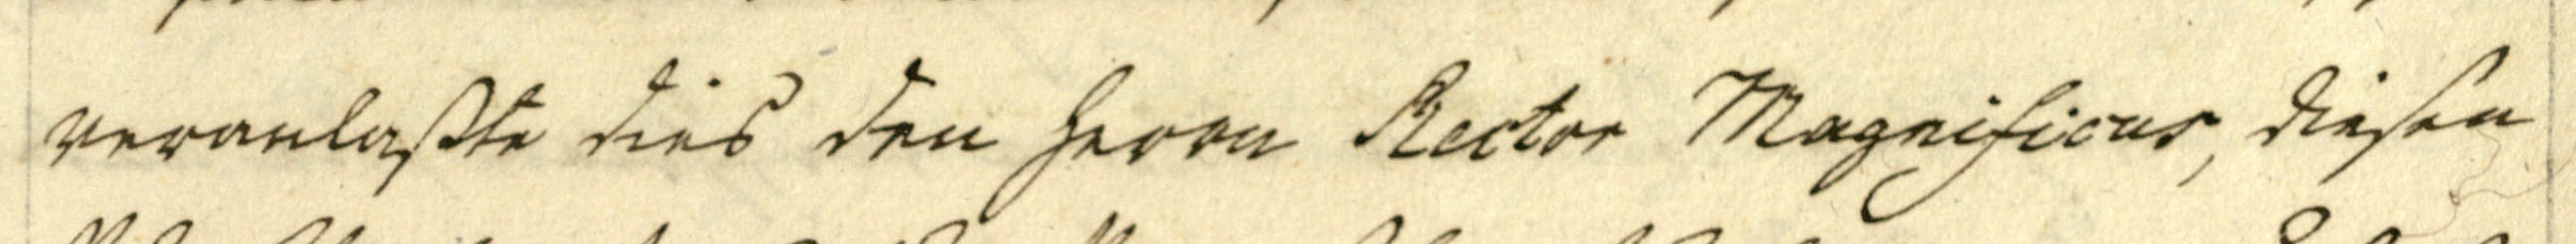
veranlaßte dies den Herrn Rector Magnificus, diesen
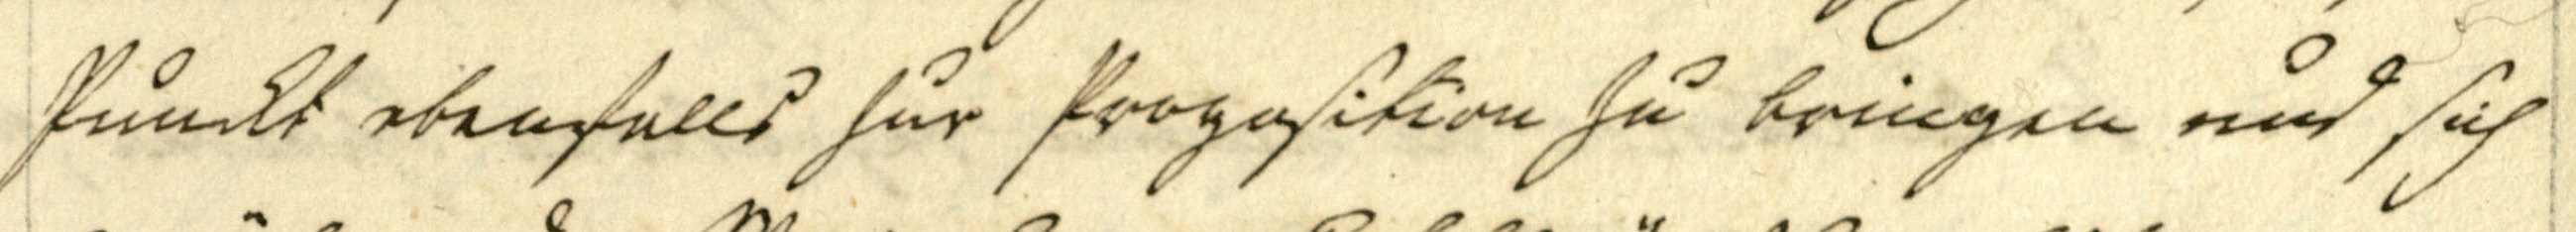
Punckt ebenfalls zur Proposition zu bringen und sich
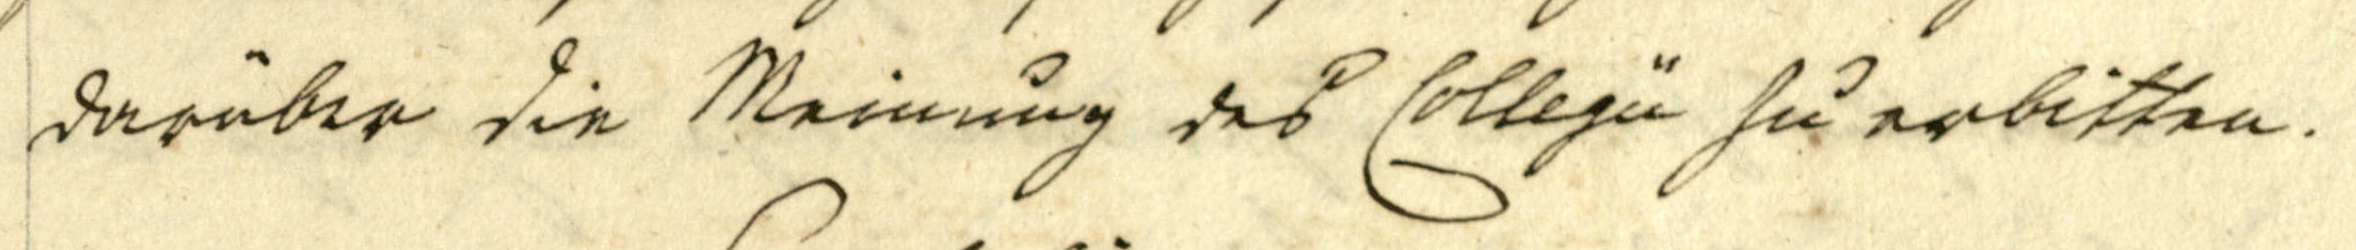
darüber die Meinung des Collegii zu erbitten.
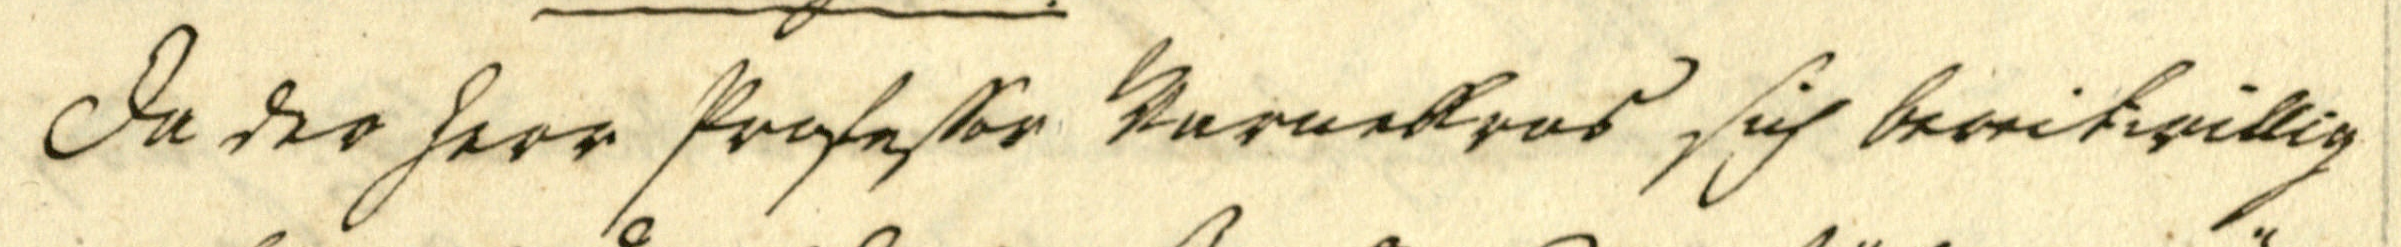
Da der Herr Professor Warnekros sich bereitwillig
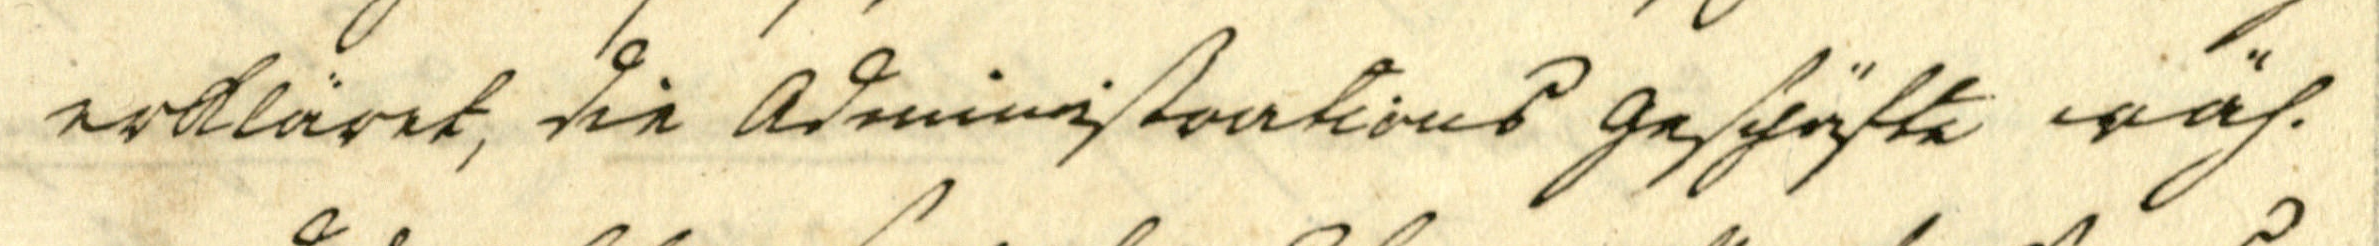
erkläret, die Administrations Geschäfte wäh¬
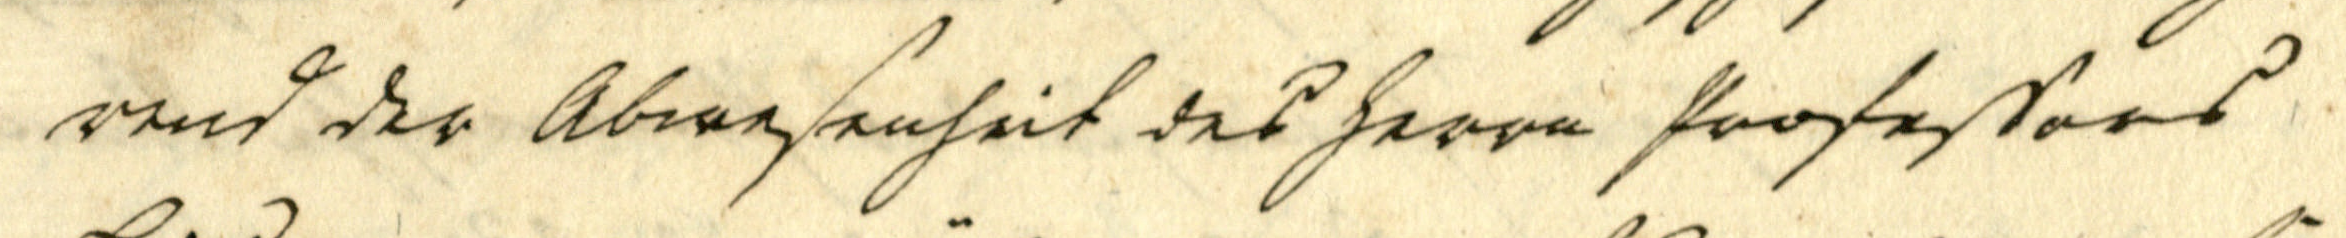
rend der Abwesenheit des Herrn Professors
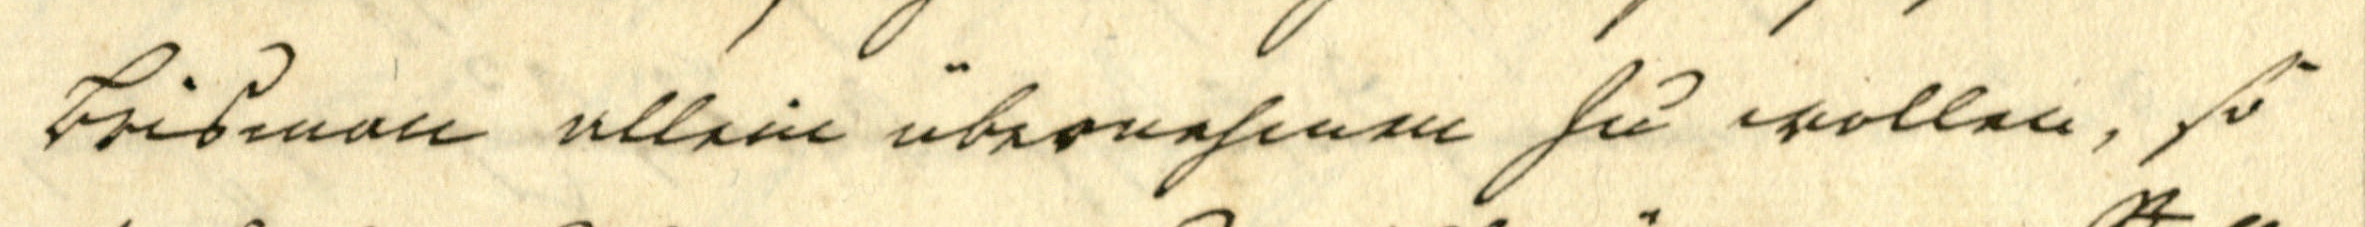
Brisman allein übernehmen zu wollen, so
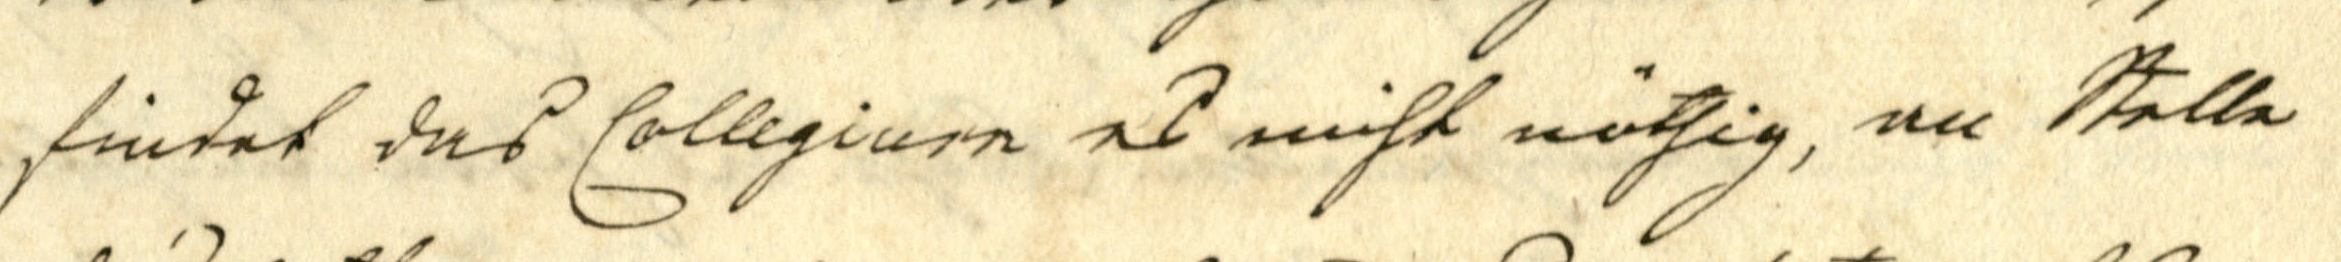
findet das Collegium es nicht nöthig, an Stelle
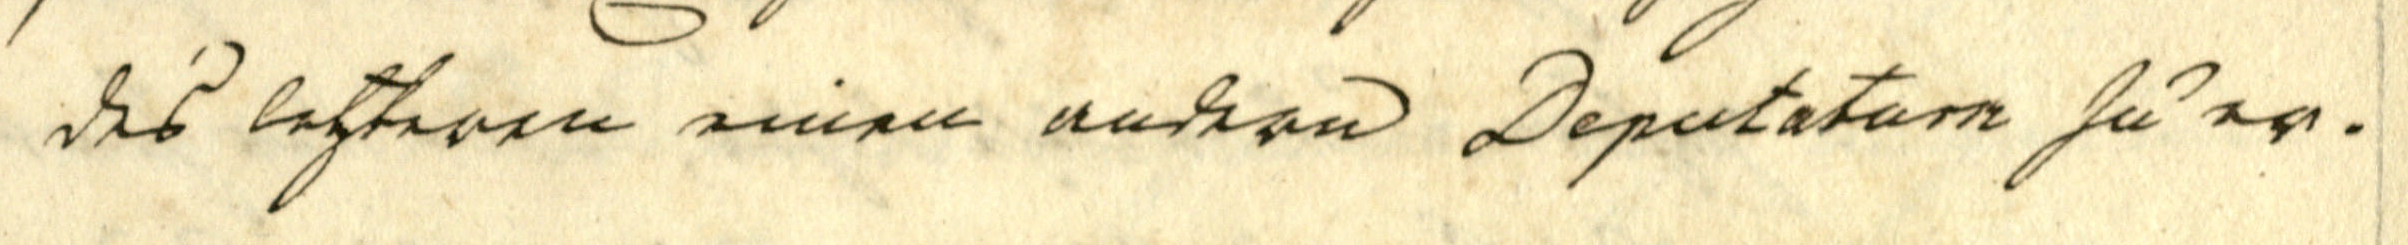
des letzteren einen andern Deputatum zu er¬
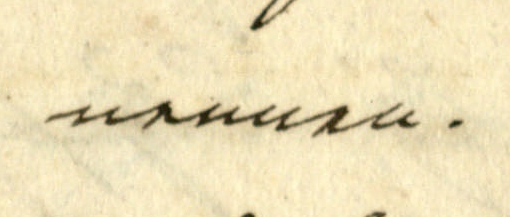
nennen.
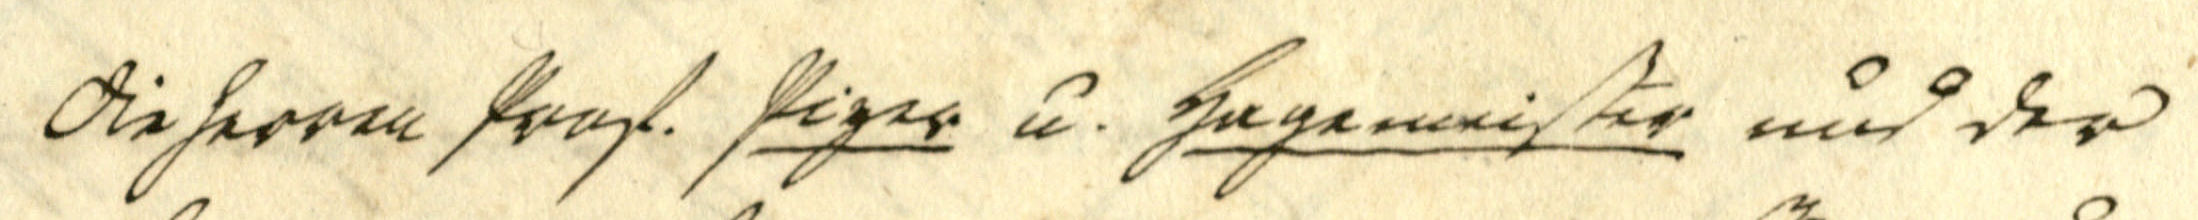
Die Herren Prof. Piper. 2. Hagemeister und der
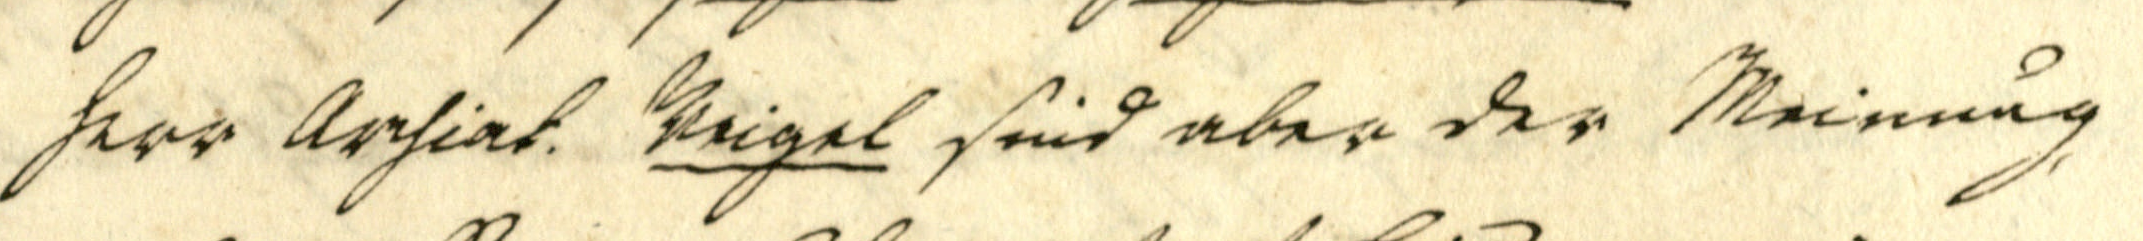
Herr Archiat. Weigel sind aber der Meinung,
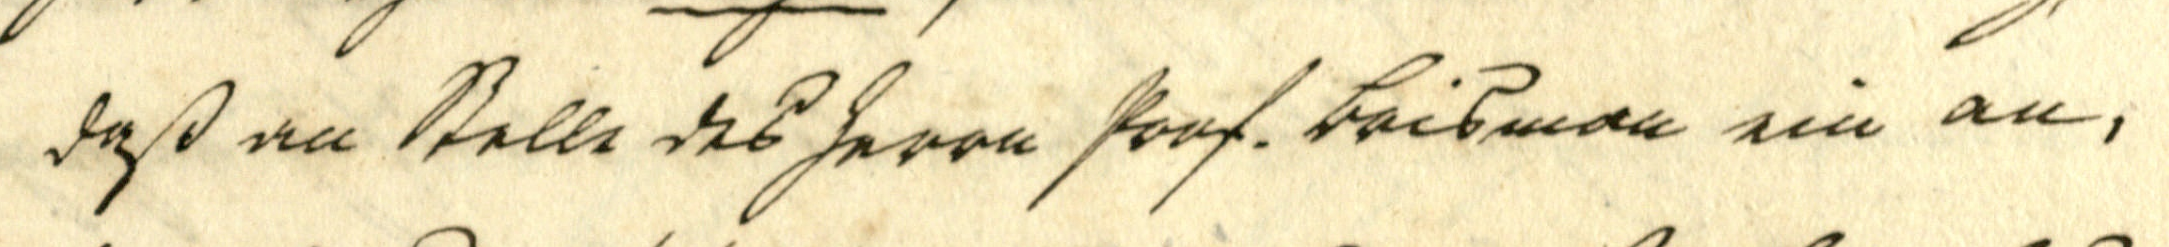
daß an Stelle des Herrn Prof. Brisman um an¬
